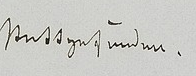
stattgefunden.
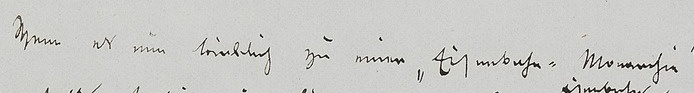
Wenn es nun wirklich zu einer «Eisenbahn-Monarchie»
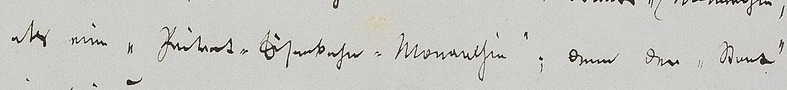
als eine «Privat-Eisenbahn-Monarchie»; denn der «Staat»
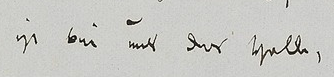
ist bei uns das Volk,
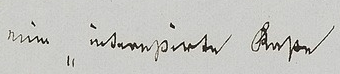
eine «intereßirte Kaste»
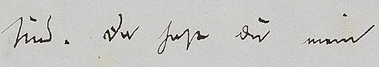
sind. Da hast du mein
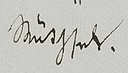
Räthsel.
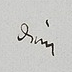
Dein
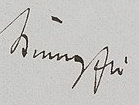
Stämpfli
